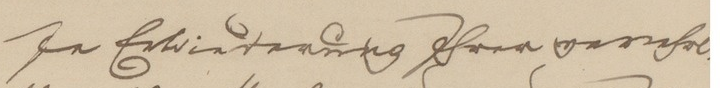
In Erwiederung Ihrer verehrl.
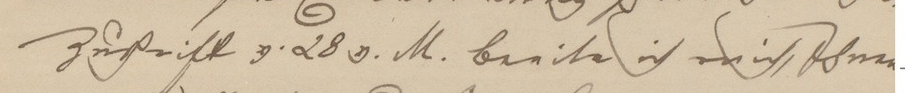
Zuschrift v. 28 v. M. beeile ich mich, Ihnen
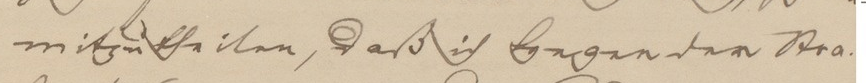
mitzutheilen, daß ich wegen der Stra-
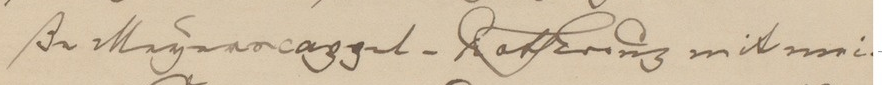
ße Meyerscappel–Rothkreuz mit mei-
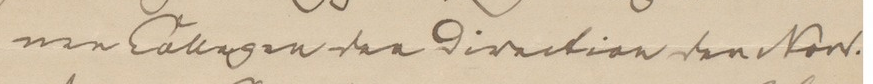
nen Collegen der Direction der Nord-
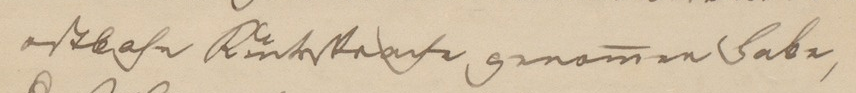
ostbahn Rücksprache genommen habe,
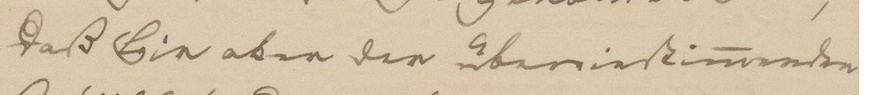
daß wir aber der übereinstimmenden
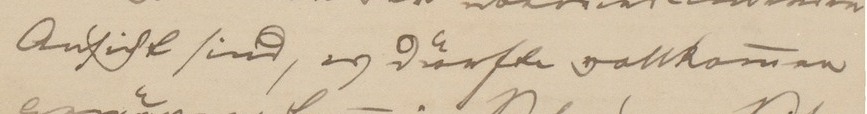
Ansicht sind, es dürfte vollkommen
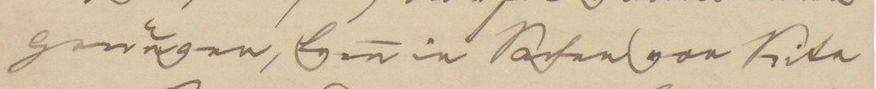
genügen, wenn in Sachen von Seite
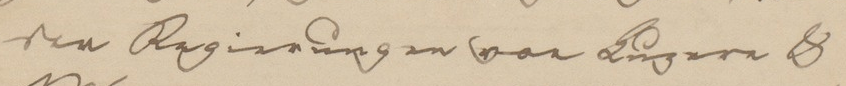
der Regierungen von Luzern &
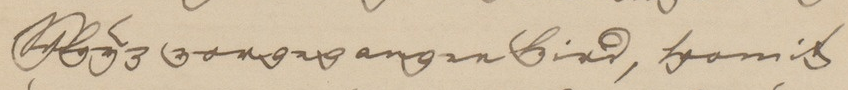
Schwyz vorgegangen wird, womit
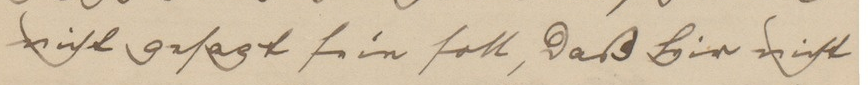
nicht gesagt sein soll, daß wir nicht
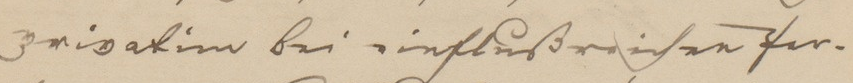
privatim bei einflußreichen Per-
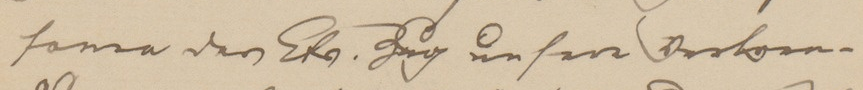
sonen des Cts. Zug unsere Verwen-
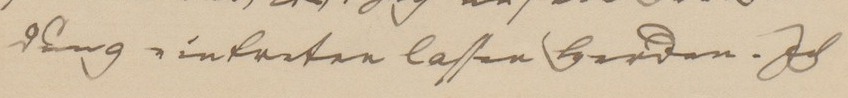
dung eintreten lassen werden. Ich
